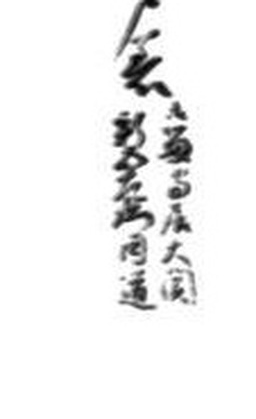新五左衛門同道

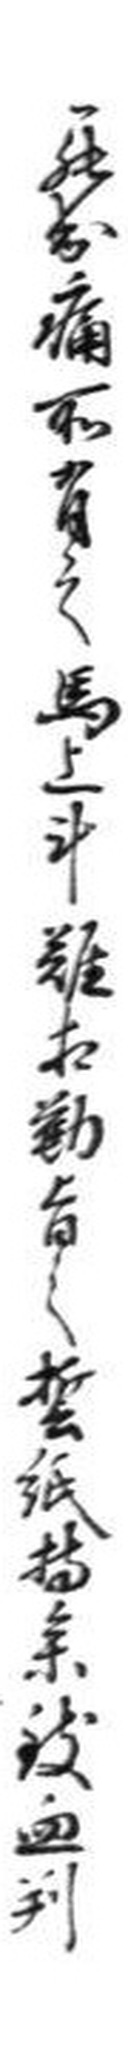罷出痛所有之馬上斗難相勤旨之誓紙持参致血判
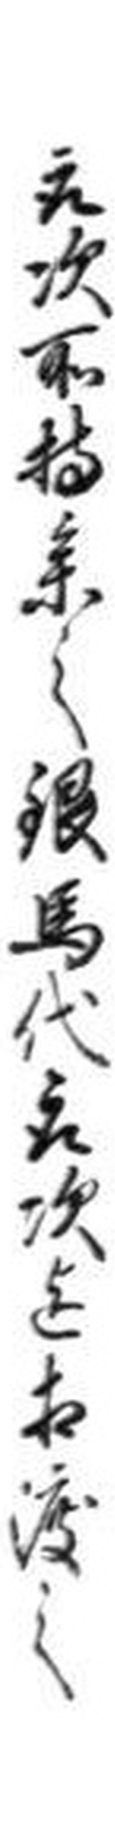取次所持参之銀馬代取次迄相渡之
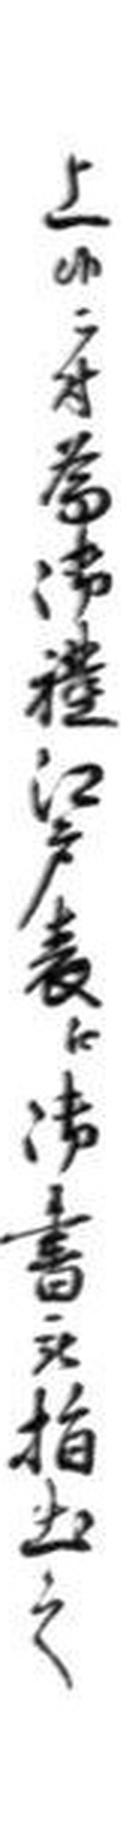上候ニ付為御礼江戸表江御書被指出之
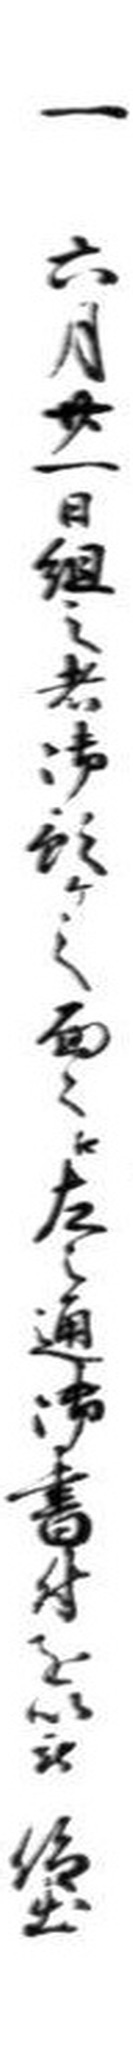一六月廿一日組之者於預ケ之面々江左之通御書付を以被仰出
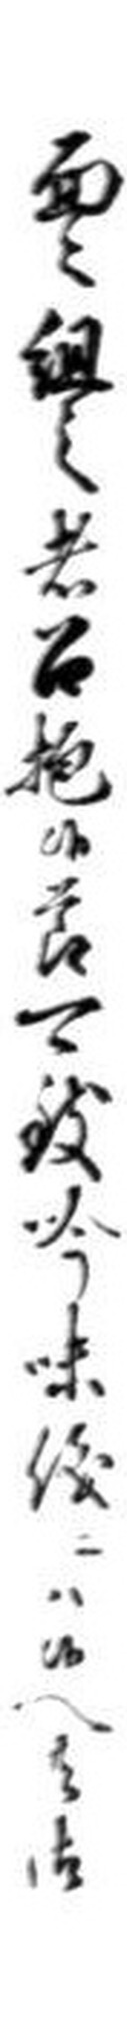面々組之者召抱候節可致吟味儀ニハ候へ共御
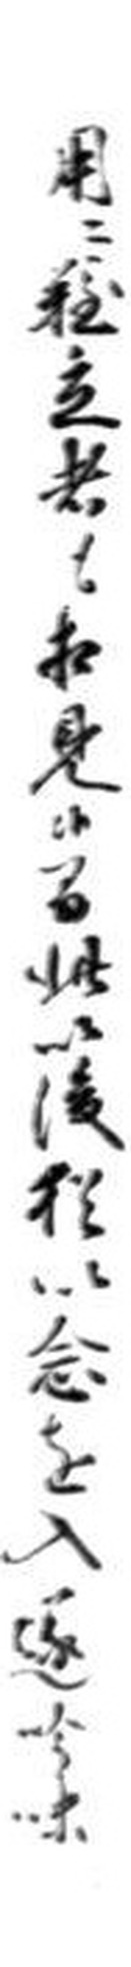用ニ難立者も相見候間此以後猶以念を入遂吟味
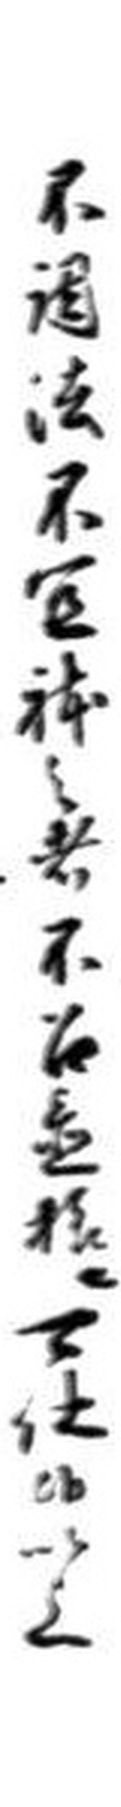不調法不宜体之者不召置様ニ可仕候以上
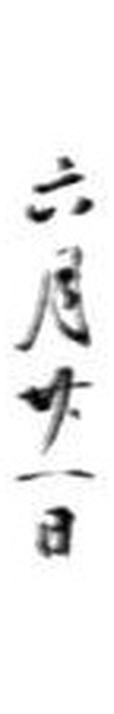六月廿一日
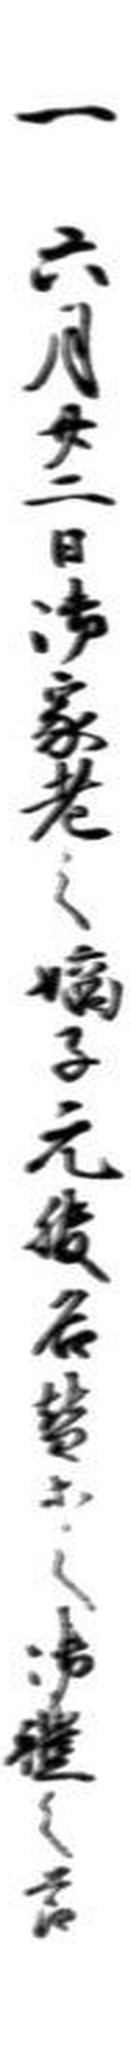一六月廿二日御家老之嫡子元服名替等之御礼之節
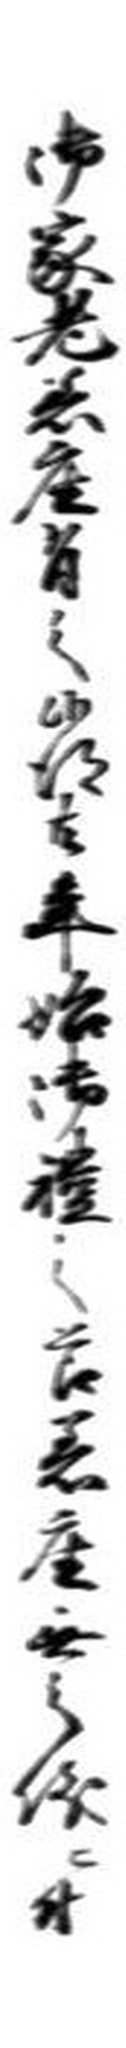御家老着座有之候得共年始御礼之節着座無之儀ニ付
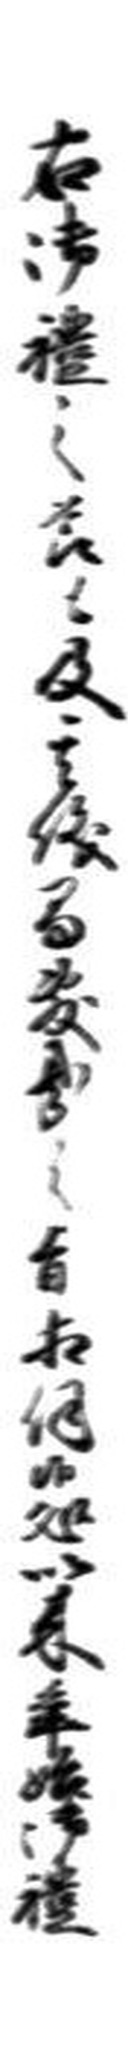右御礼之節も及其儀間敷哉之旨相伺候処以来年始御礼
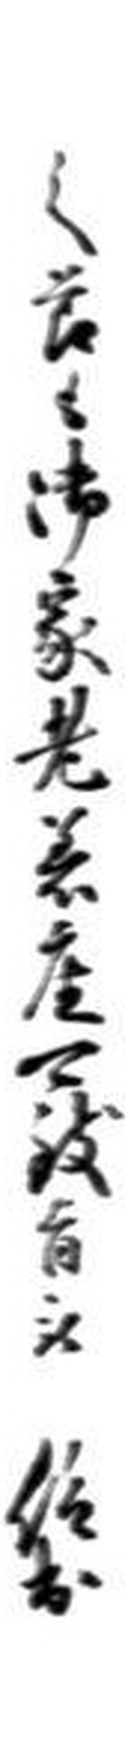之節も御家老着座可致旨被仰出
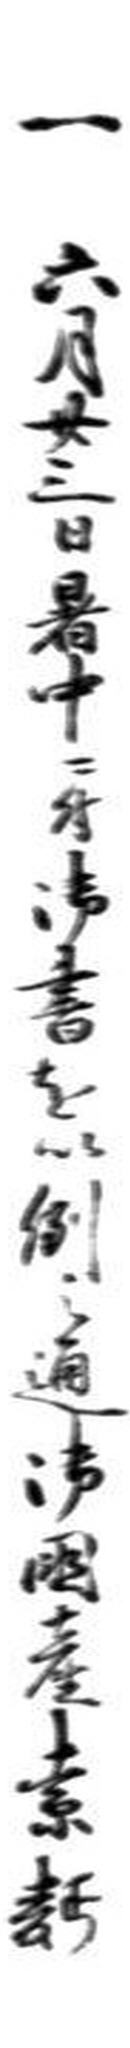一六月廿三日暑中ニ付御書を以例之通御国産素麪
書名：家譜 三十二 吉邦公 従享保二年到享保三年
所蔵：福井県文書館 Fukui Prefectural Archives
